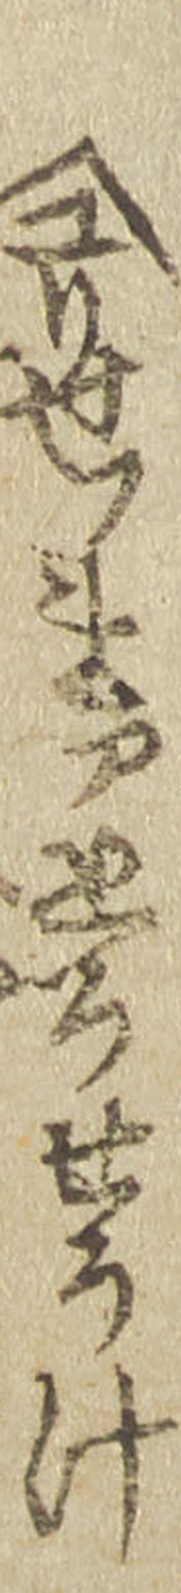〽ユリせまアとらせう汁
